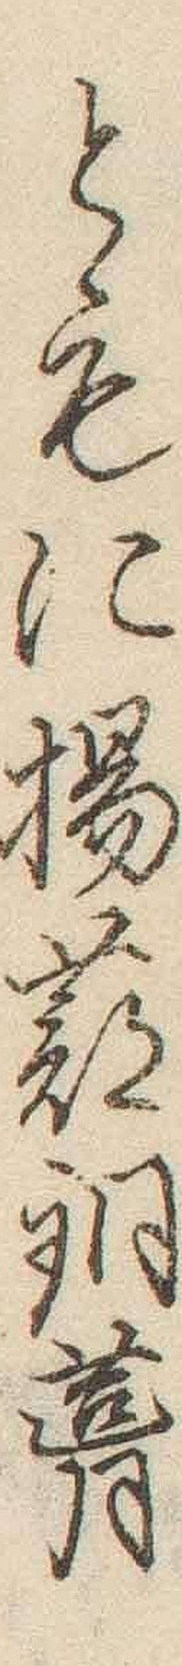ともに揚蔀銅葺
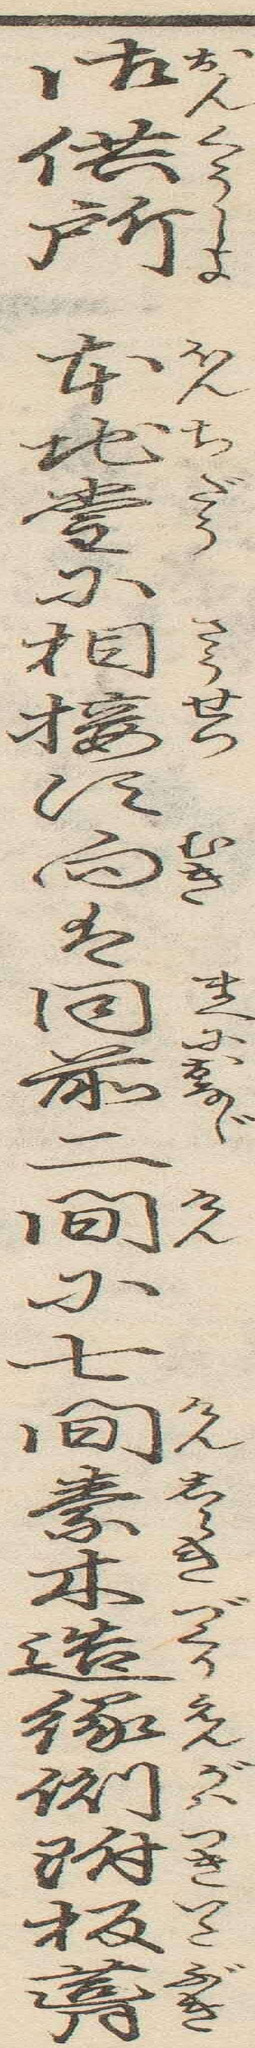御供所本地堂に相接す向は同前二間に七間素木造縁側附板葺
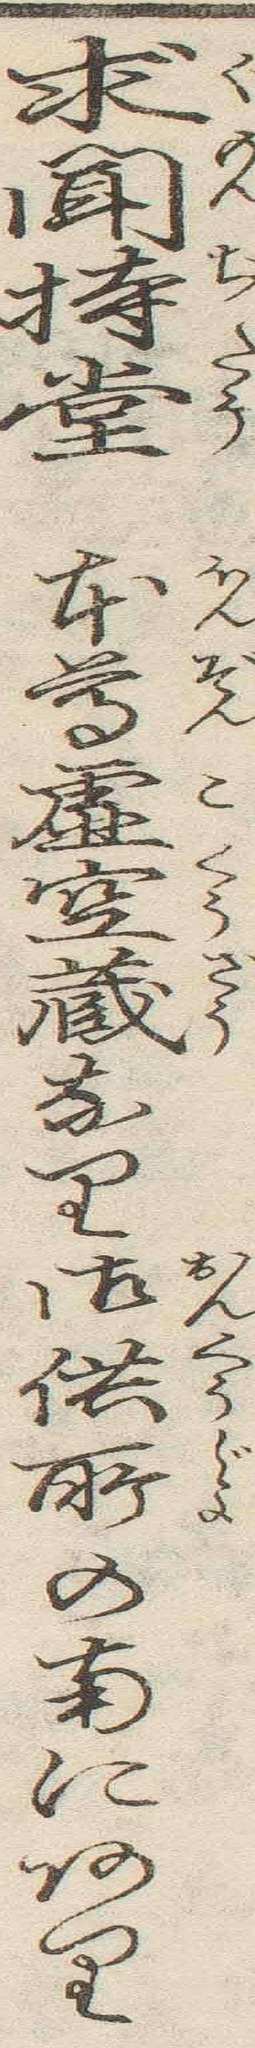求聞持堂本尊虚空蔵なり御供所の南にあり
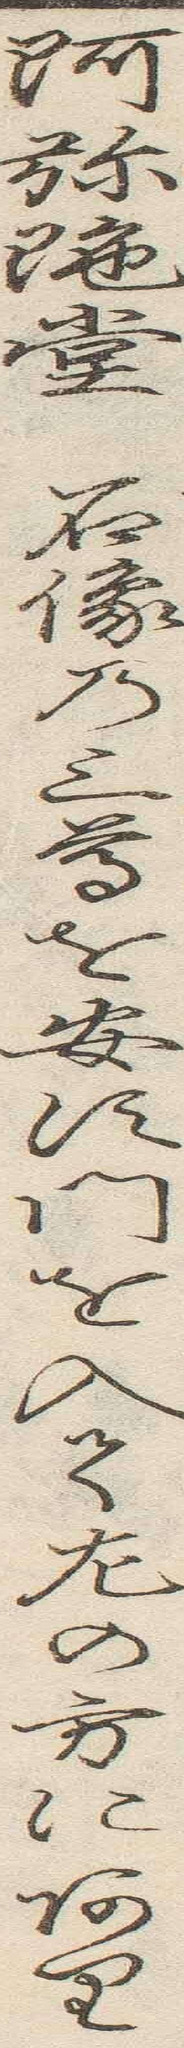阿弥陀堂石像の三尊を安す門を入て㔫の方にあり
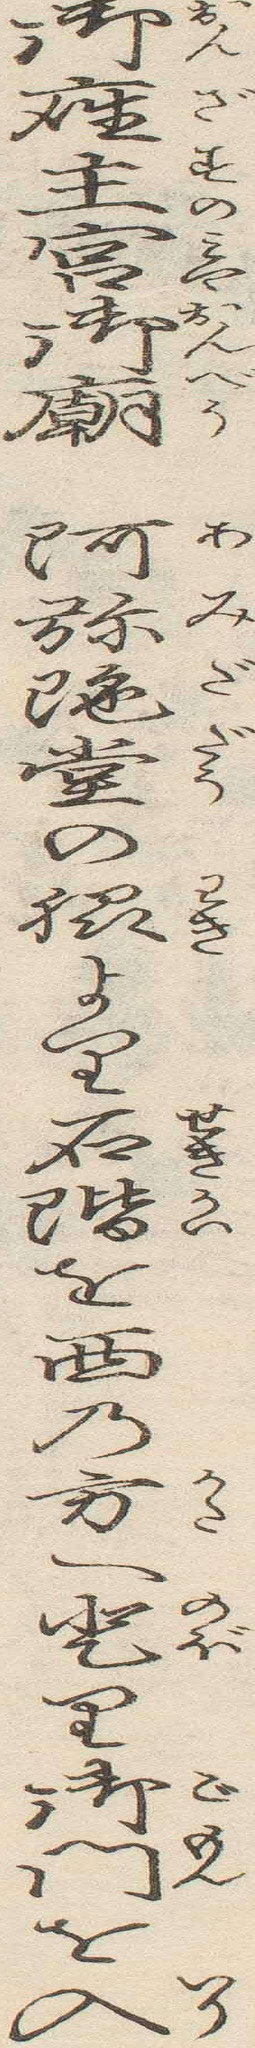御座主宮御廟阿弥陀堂の脇より石階を西の方へ登り御門を入
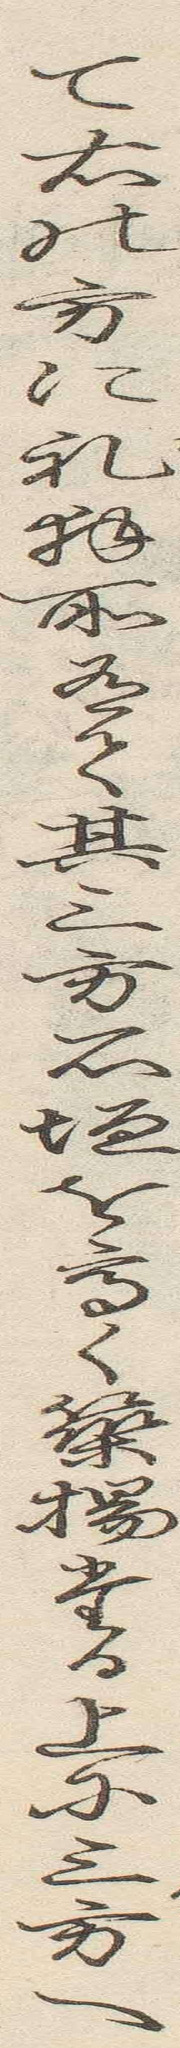て右の方に礼拜所有て其三方石垣を高く築揚たる上に三方へ
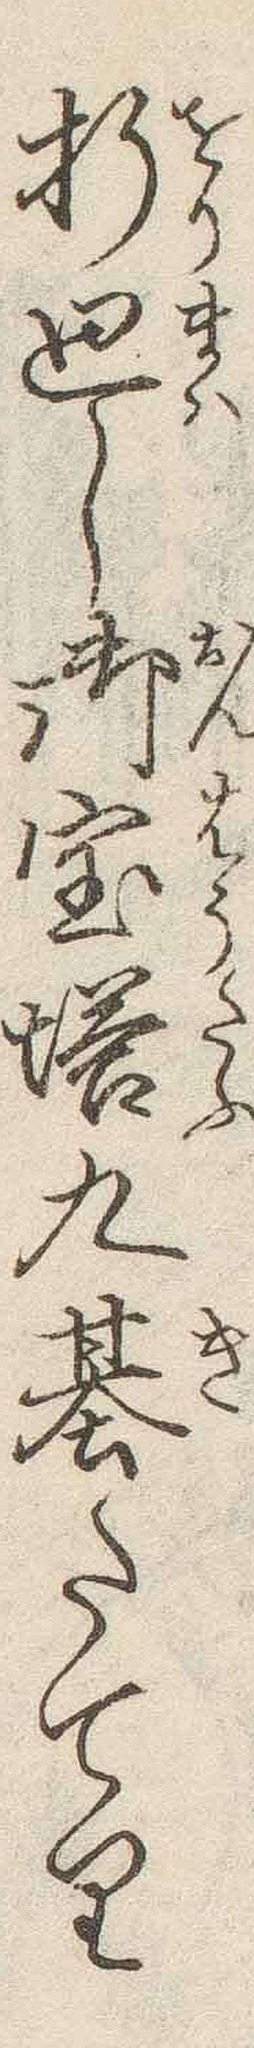折廻し御宝塔九基たてり
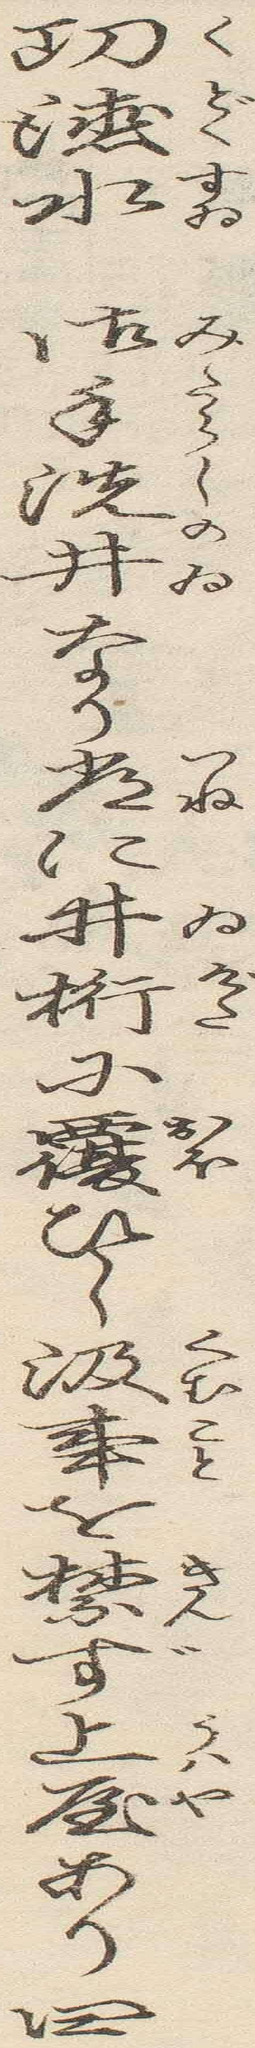㓛德水御手洗井なり常に井桁に覆ひし汲事を禁ず上屋あり四
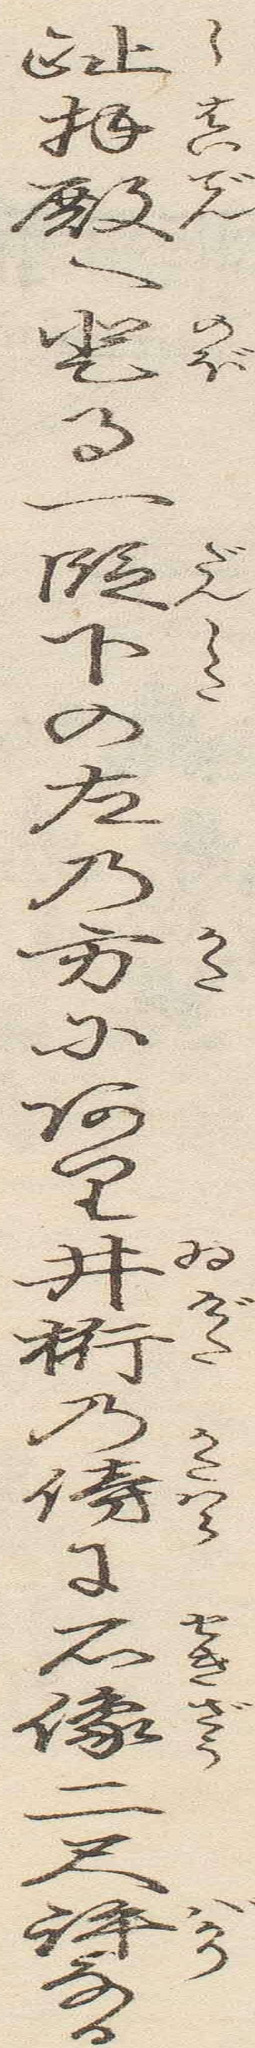趾拜殿へ登る一段下の左の方にあり井桁の傍に石像二尺許なる
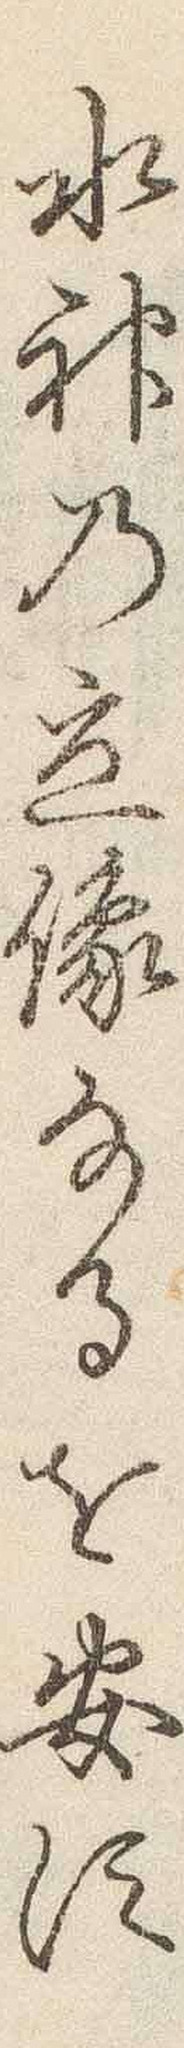水神の立像なるを安す
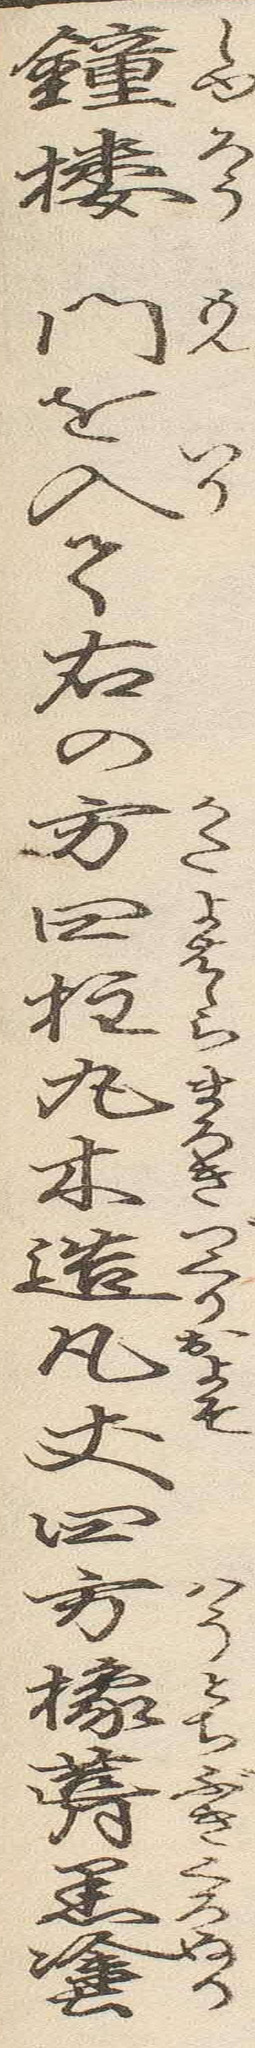鐘楼門を入て右の方四柱丸木造凡丈四方橡葺黒塗
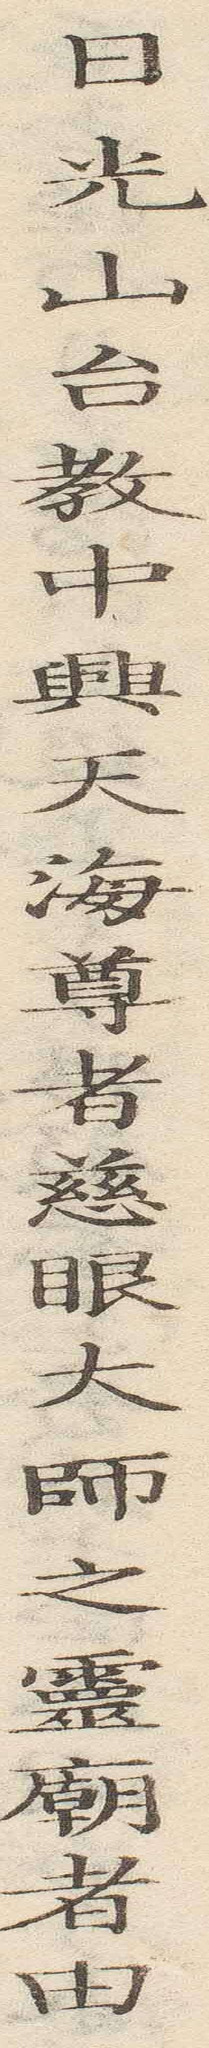日光山台教中興天海尊者慈眼大師之靈廟者由
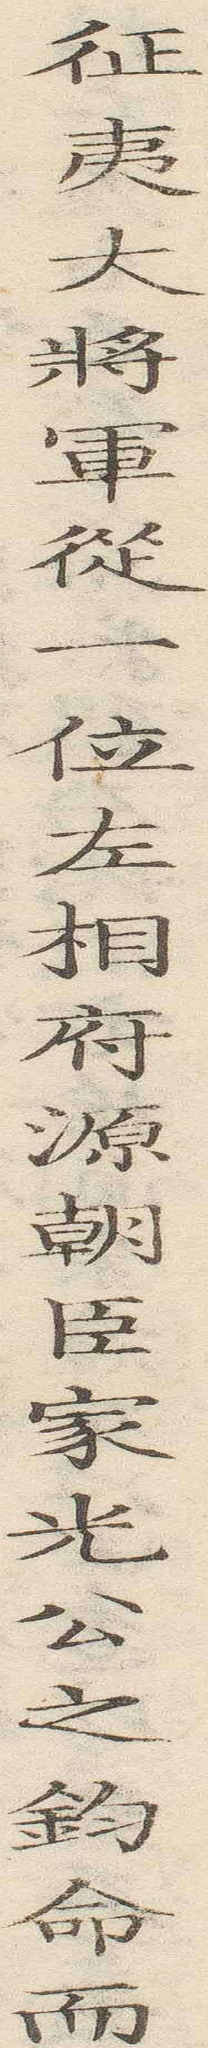征夷大將軍從一位左相府源朝臣家光公之鈞命而
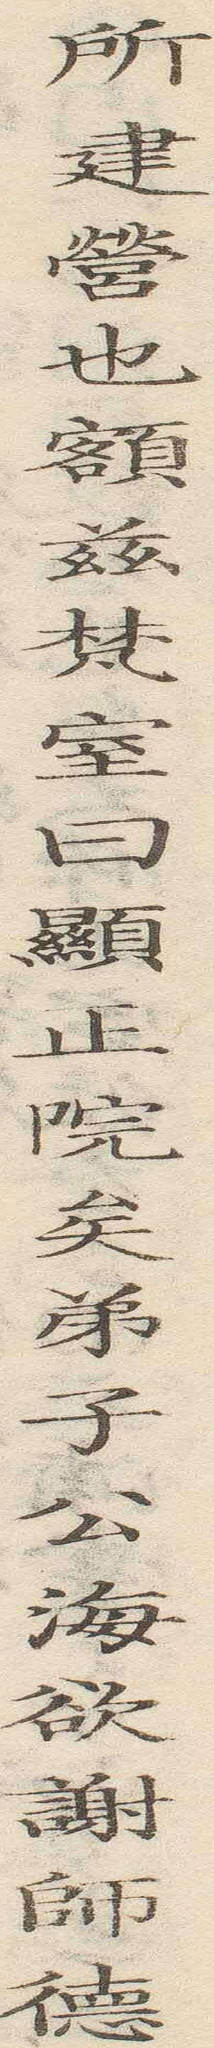所建營也額兹梵室曰顯正院矣弟子公海欲謝師德
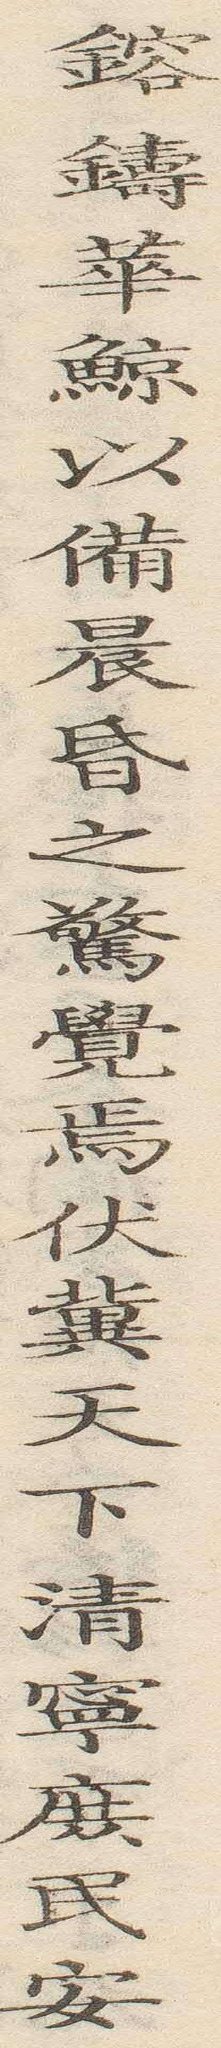鎔鑄蕐鯨以備晨昏之驚覺焉伏冀天下清寧庻民安
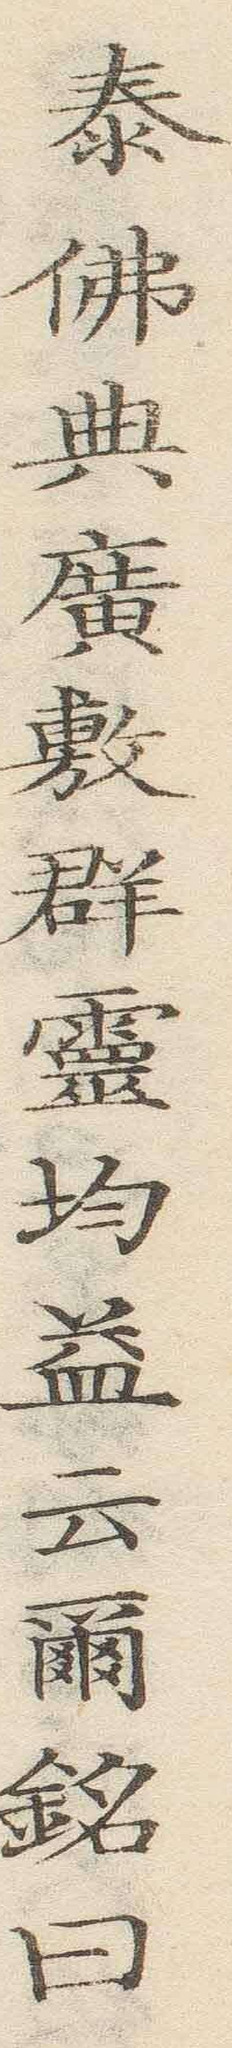泰佛典廣敷群靈均益云爾銘曰
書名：日光山志
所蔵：東京学芸大学附属図書館 国文学研究資料館
